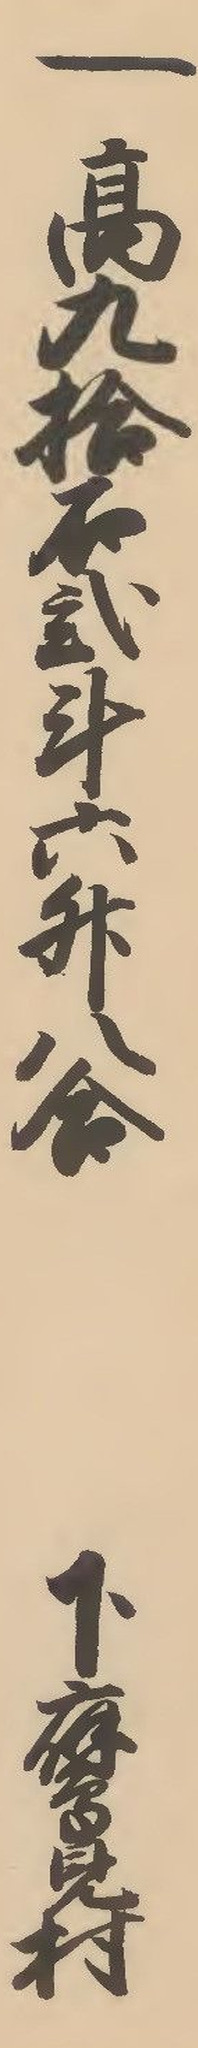一高九拾石弐斗六升八合下鷹見村
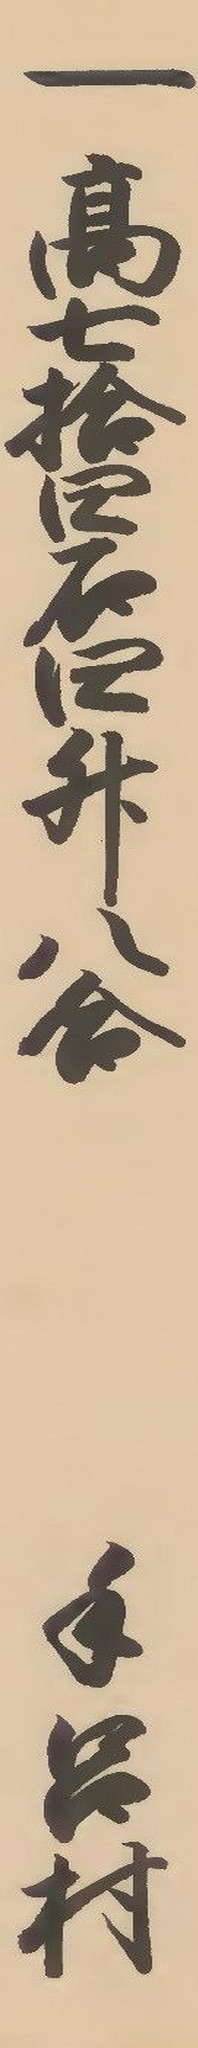一高七拾四石四升八合手呂村
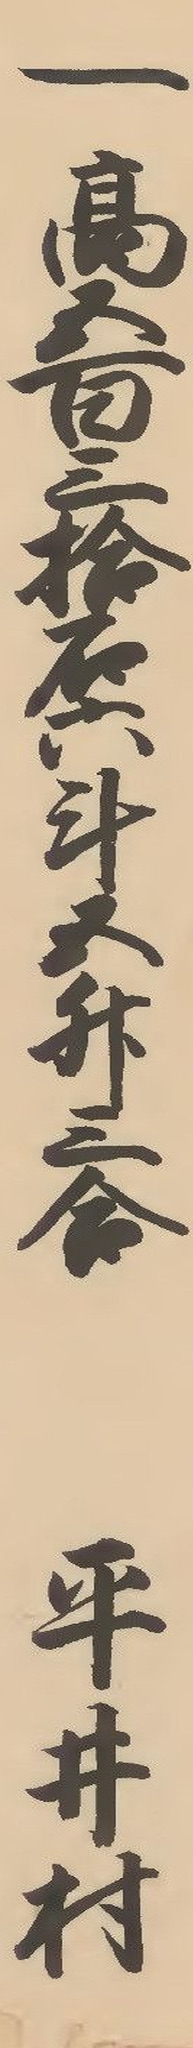一高五百三拾石六斗五升三合平井村
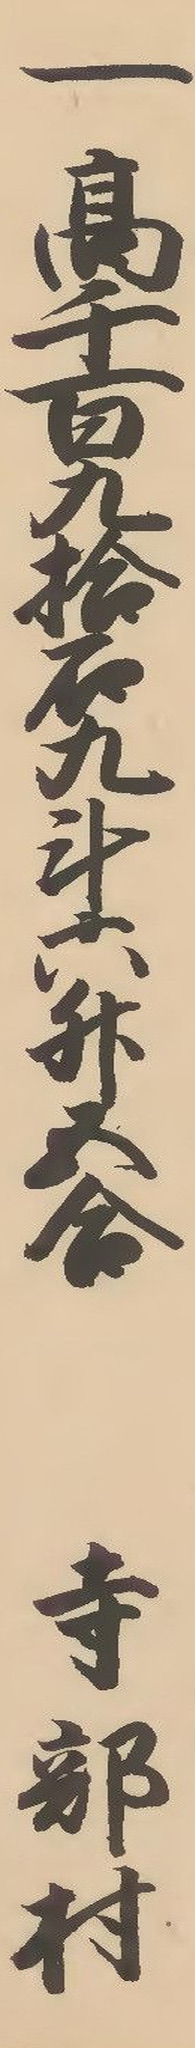一高千百九拾石九斗六升五合寺部村
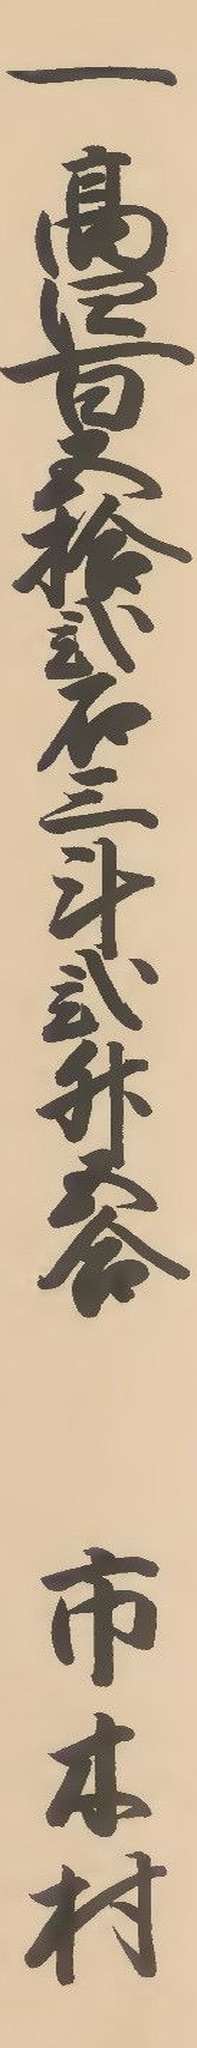一高四百五拾弐石三斗弐升五合市木村
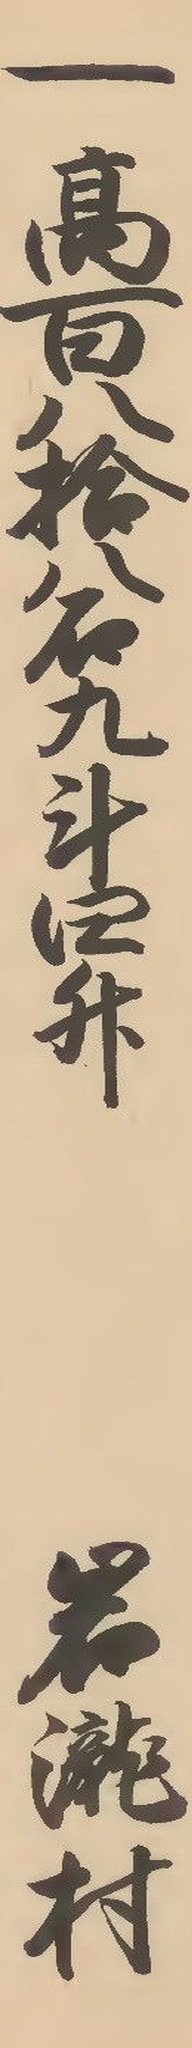一高百八拾八石九斗四升岩滝村
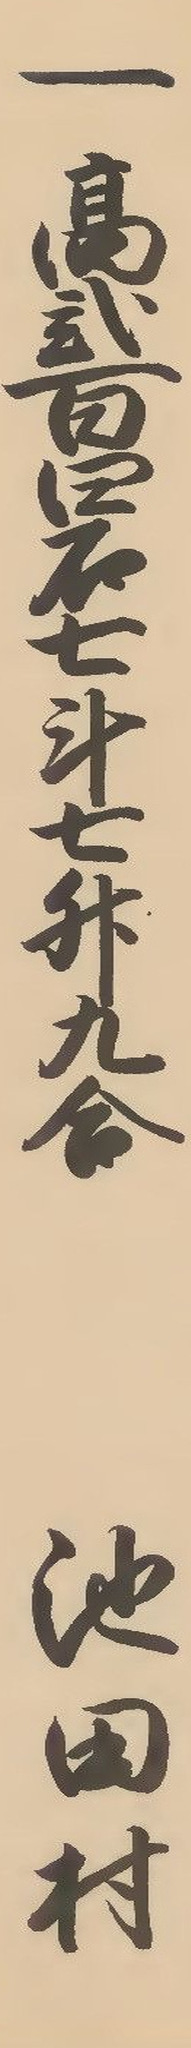一高弐百四石七斗七升九合池田村
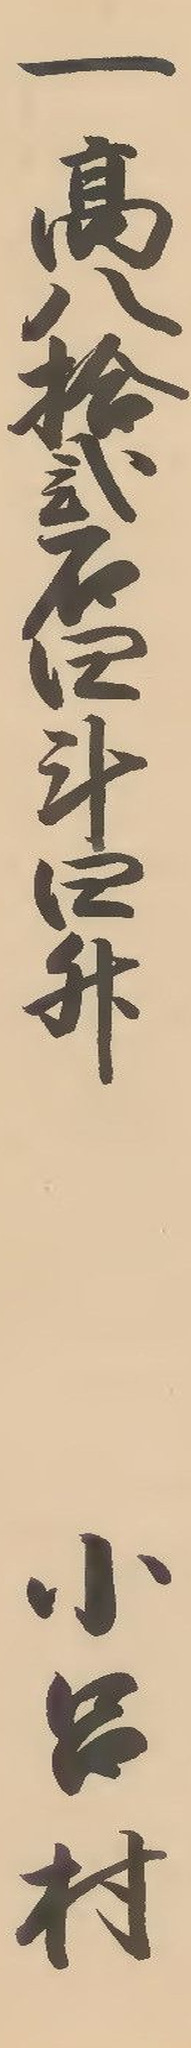一高八拾弐石四斗四升小呂村

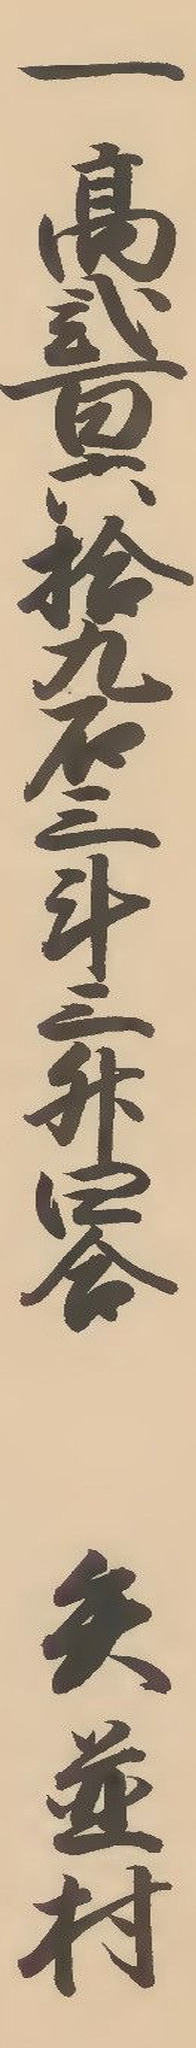一高弐百六拾九石三斗三升四合矢並村
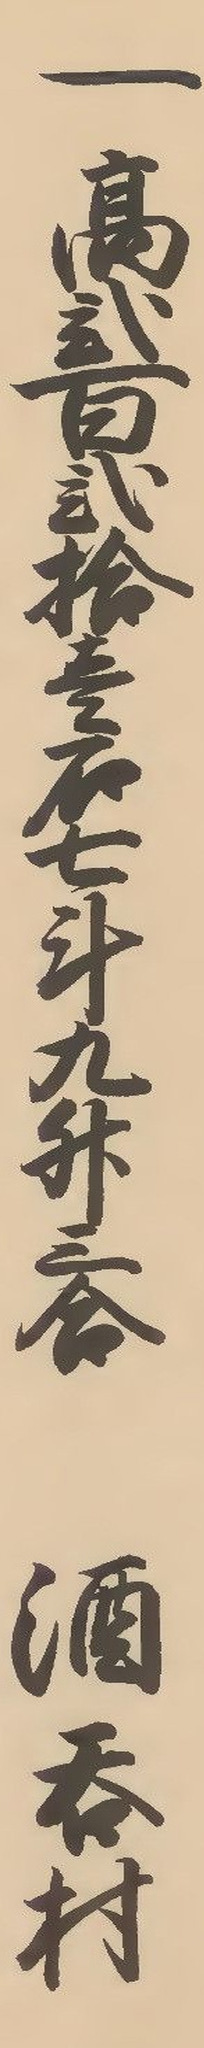一高弐百弐拾壱石七斗九升三合酒呑村
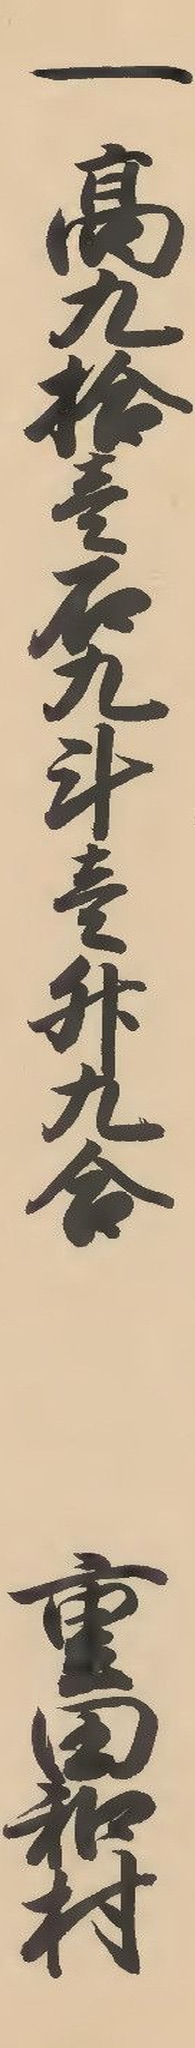一高九拾壱石九斗壱升九合重田和村
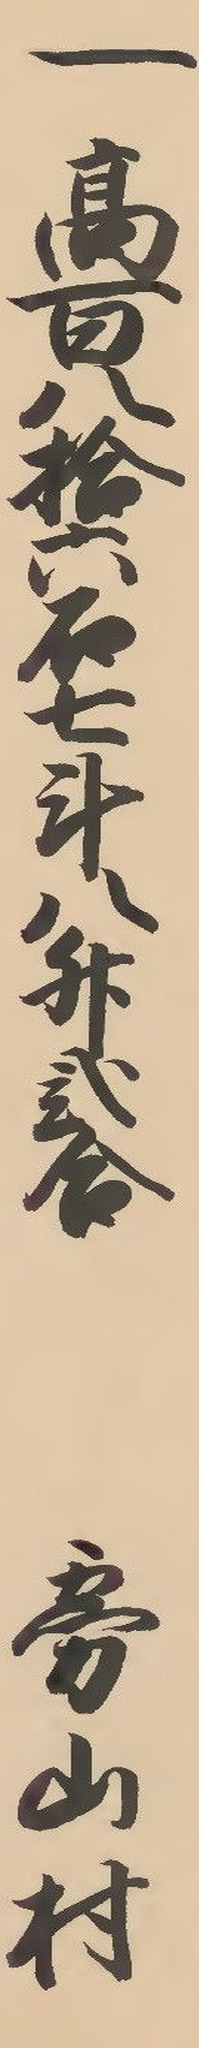一高百八拾六石七斗八升弐合霧山村
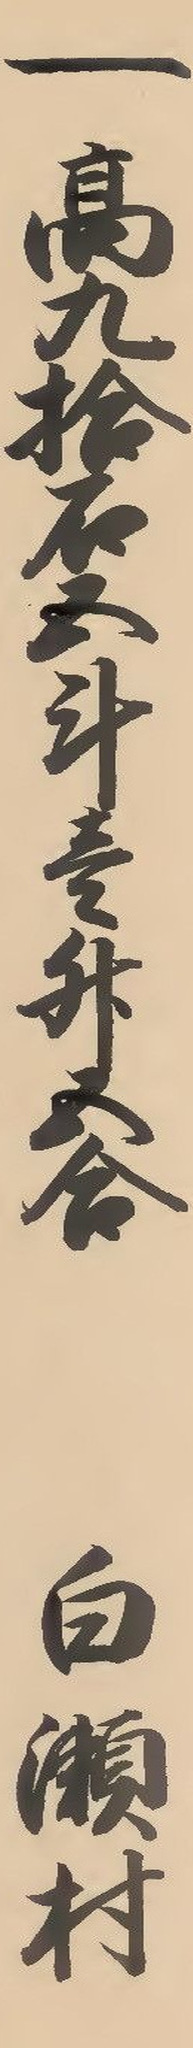一高九拾石五斗壱升五合白瀬村
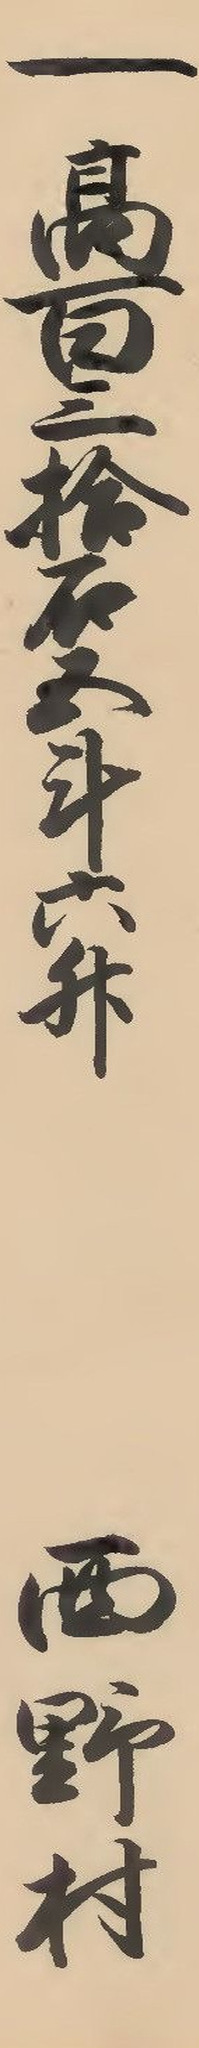一高百三拾石五斗六升西野村
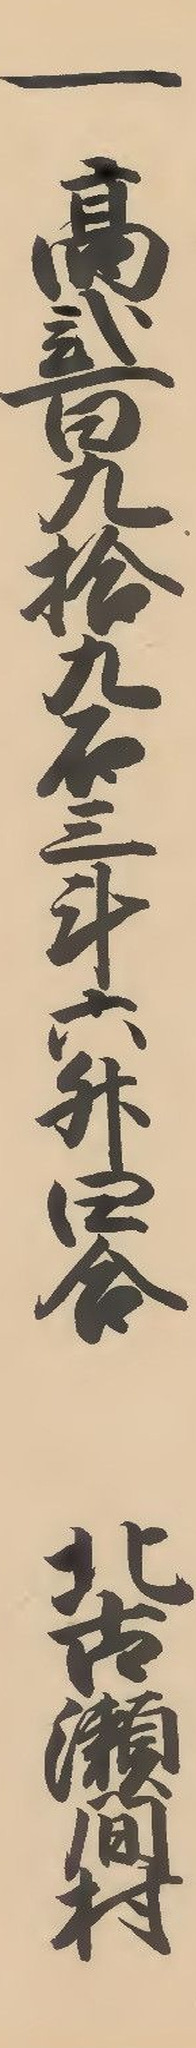一高弐百九拾九石三斗六升四合北古瀬間村
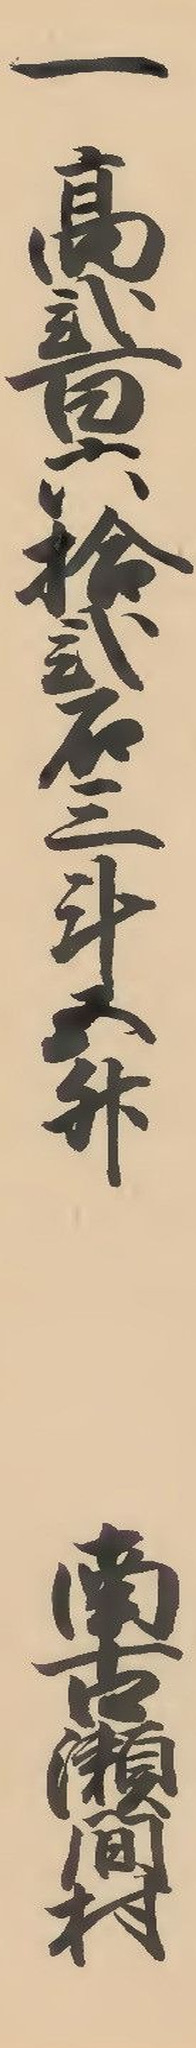一高弐百六拾弐石三斗五升南古瀬間村
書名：三河国郷帳
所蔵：国立公文書館 National Archives of Japan
